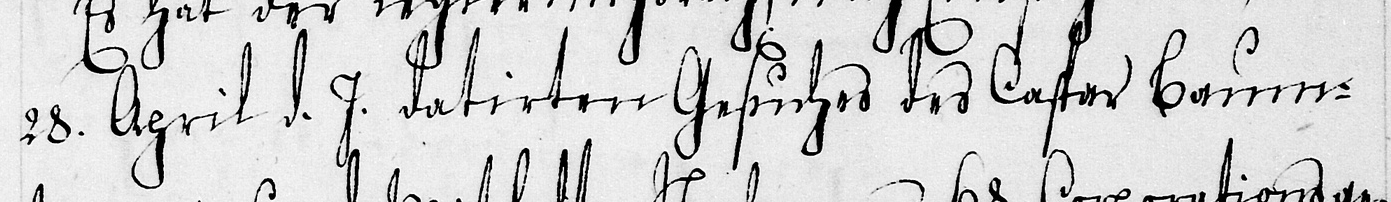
28. April d. J. datirten Gesuches des Caspar Baum¬
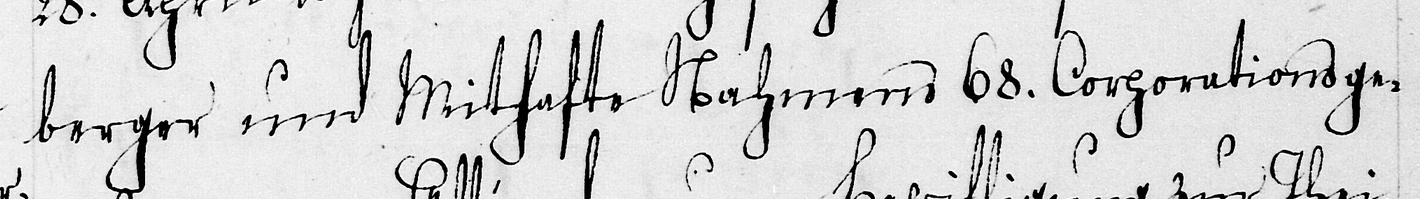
berger und Mithafte Nahmens 68. Corporationsge¬
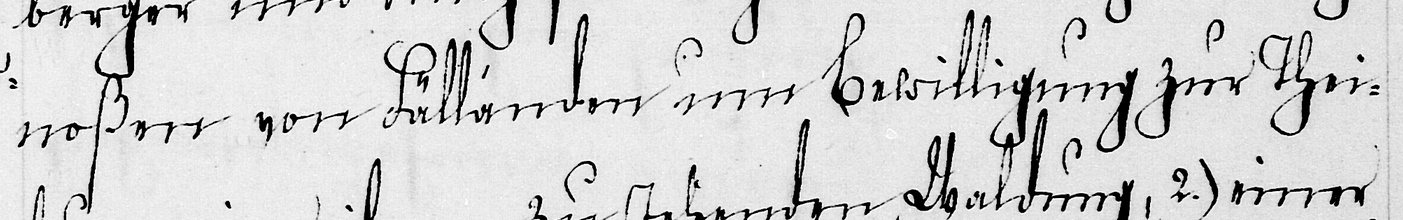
noßen von Fällanden um Bewilligung zur Thei¬
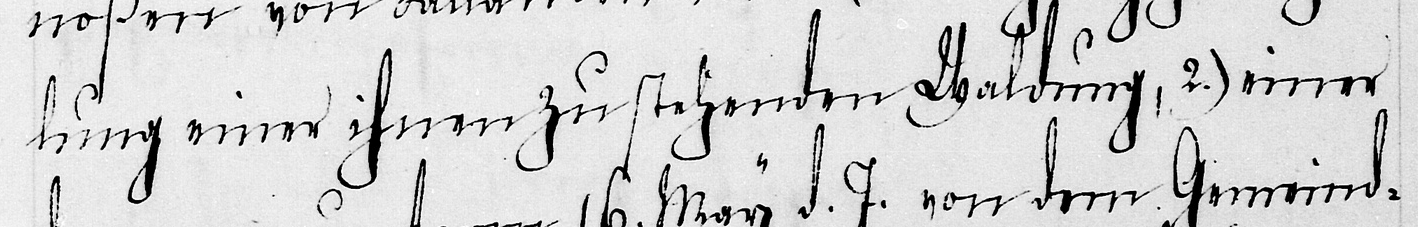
lung einer ihnen zustehenden Waldung, 2.) einer
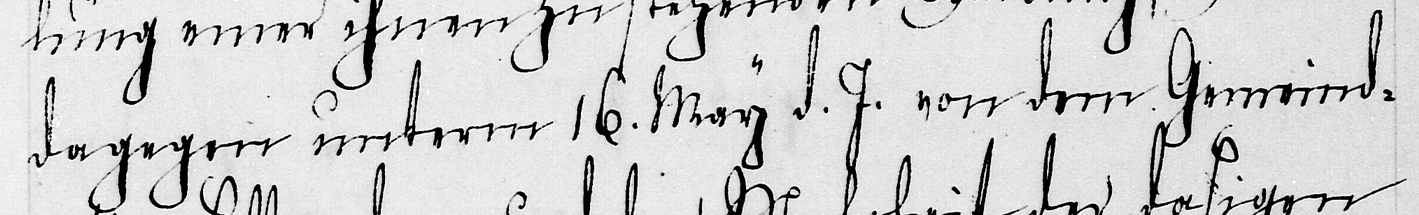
dagegen unterm 16. May d. J. von dem Gemeind¬
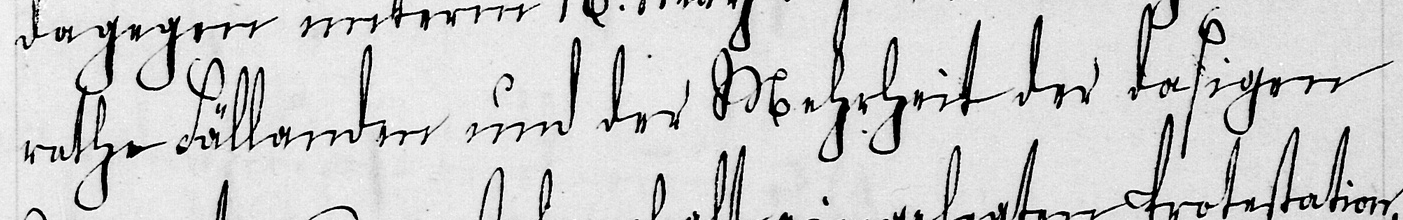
rathe Fällanden und der Mehrheit der dasigen
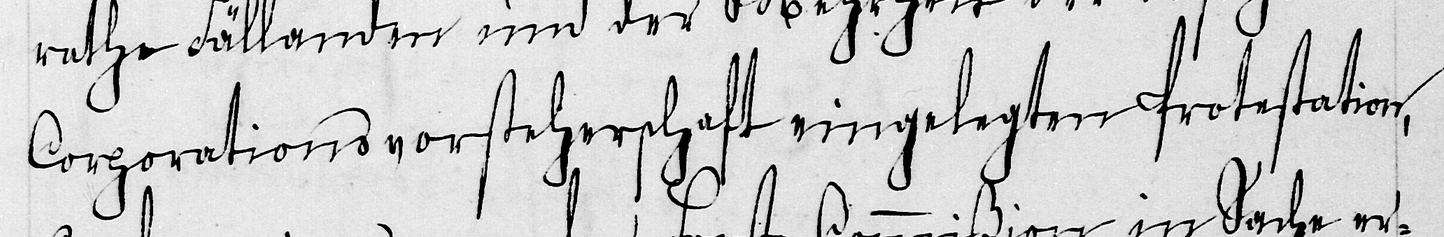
Corporationsvorsteherschaft eingelegten Protestation,
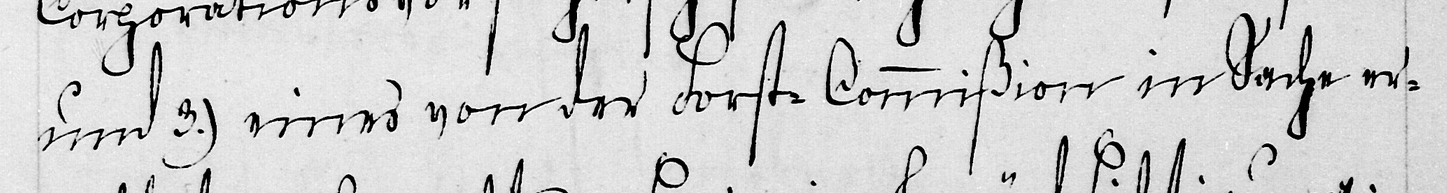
und 3.) eines von der Forst-Commißion in Sache er¬
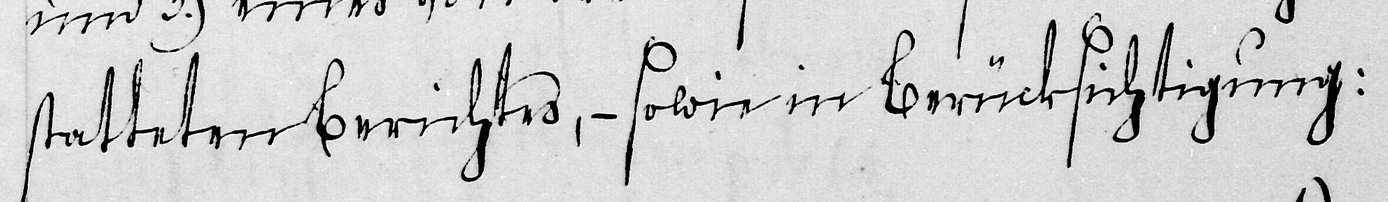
statteten Berichtes, – sowie in Berücksichtigung:
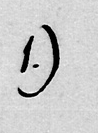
3.)
